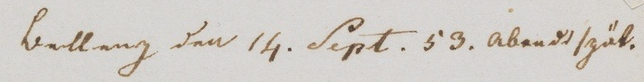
Bellenz den 14. Sept. 53. Abends spät.
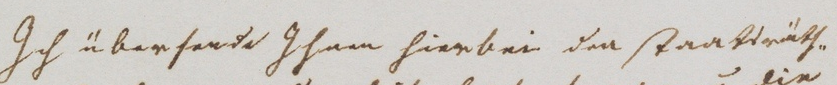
Ich übersende Ihnen hierbei den staatsräth-
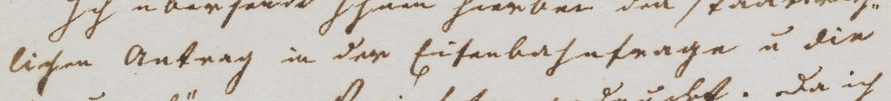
lichen Antrag in der Eisenbahnfrage u die
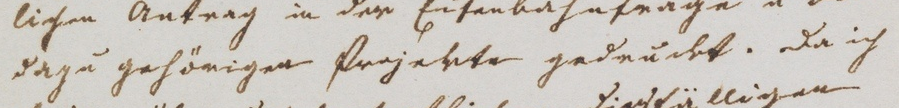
dazu gehörigen Projekte gedruckt. Da ich
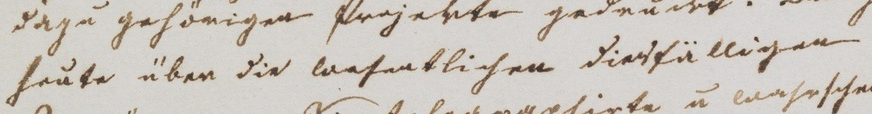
heute über die wesentlichen diesfälligen
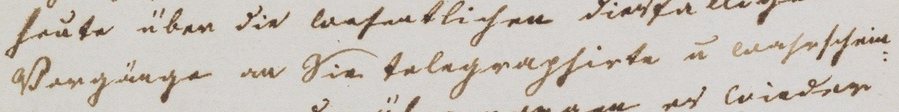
Vorgänge an Sie telegraphirte u wahrschein-
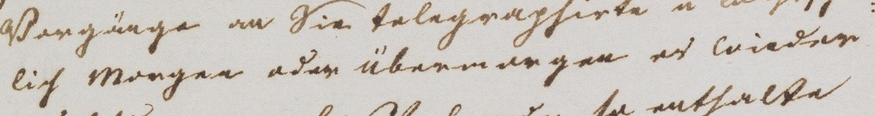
lich morgen oder übermorgen es wieder
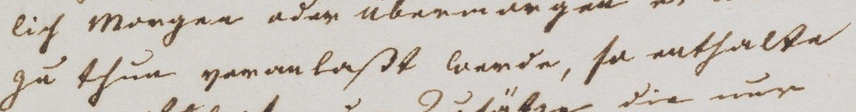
zu thun veranlaßt werde, so enthalte
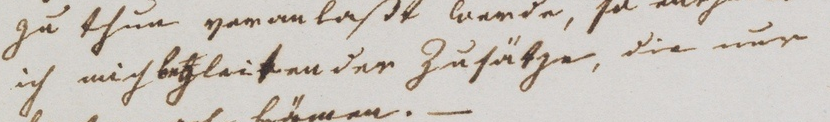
ich mich begleitender Zusätze, die nur
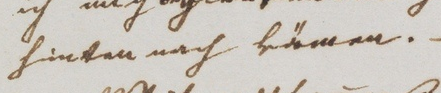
hinten nach kämen. –
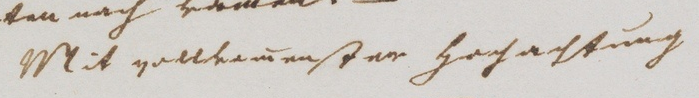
Mit vollkommenster Hochachtung
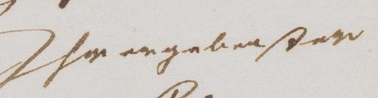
Ihr ergebenster
